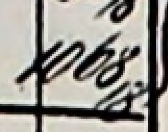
1068,8
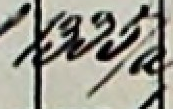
1335/a
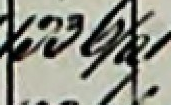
1336/a
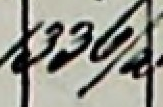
1336/a
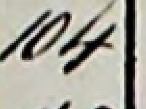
104
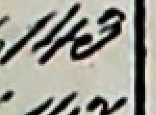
143
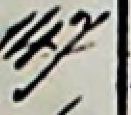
147
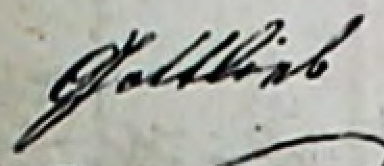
Gottlieb
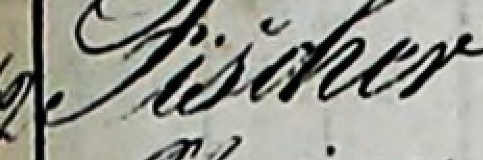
Fischer
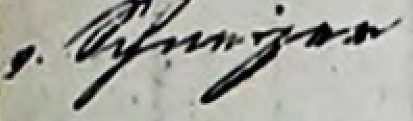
v. Schneiper
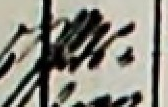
Pfds„
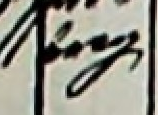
berg
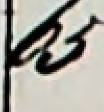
65
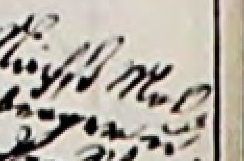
Nächst Mos„
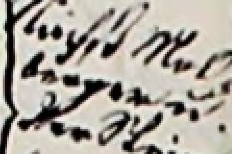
berger u.
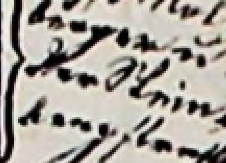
der Stein„
